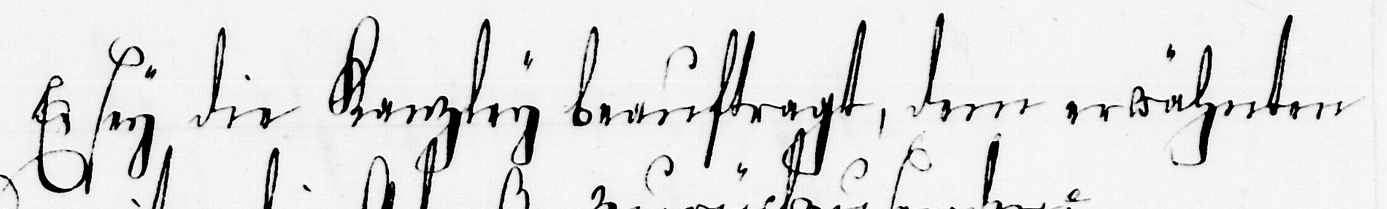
sey die Kanzley beauftragt, dem erwähnten
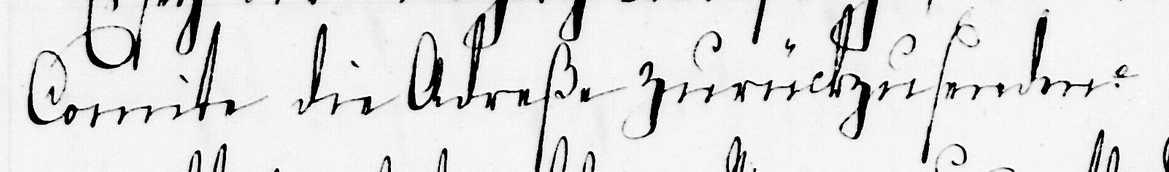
Comite die Adreße zurückzusenden.
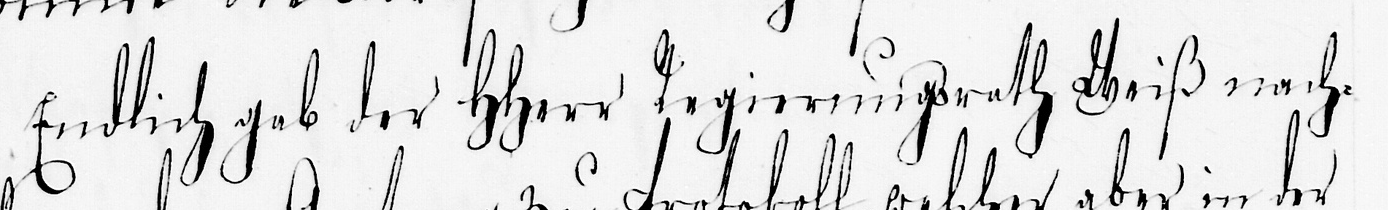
Endlich gab der HHerr Regierungsrath Weiß nach¬
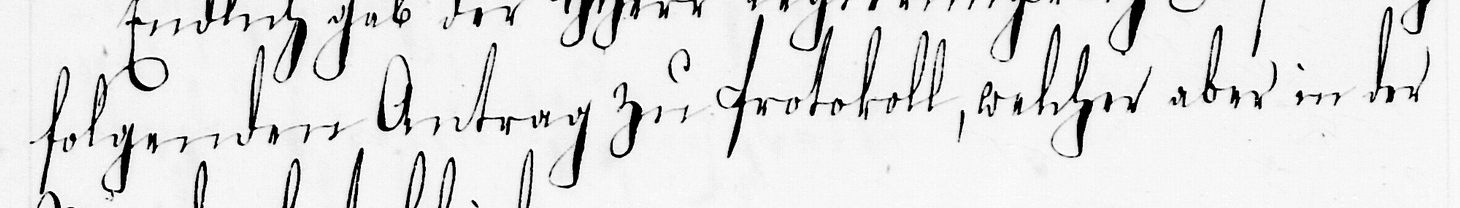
folgenden Antrag zu Protokoll, welcher aber in der
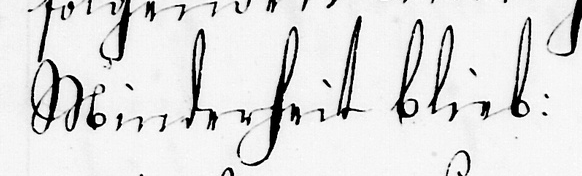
Minderheit blieb:
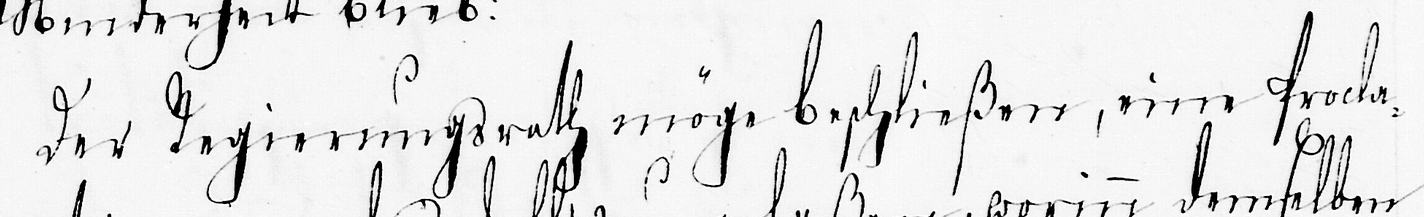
Der Regierungsrath möge beschließen, eine Procla¬
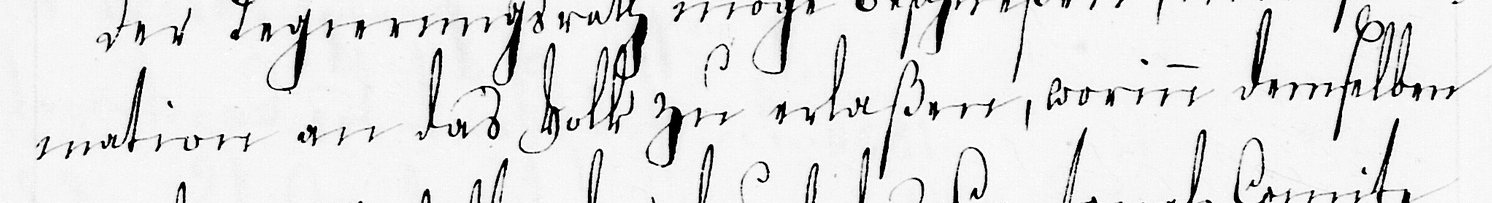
mation an das Volk zu erlaßen, worinn demselben
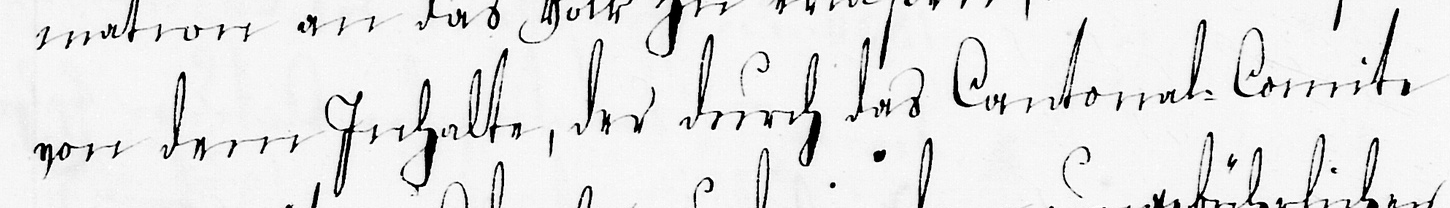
von dem Inhalte, der durch das Cantonal-Comite
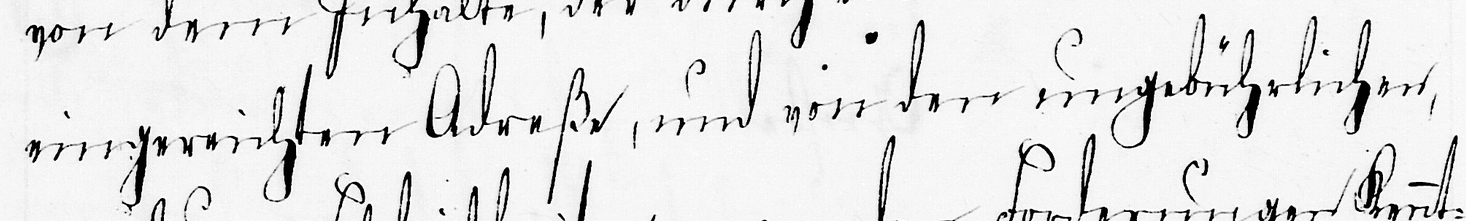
eingereichten Adreße, und von den ungebührlichen,
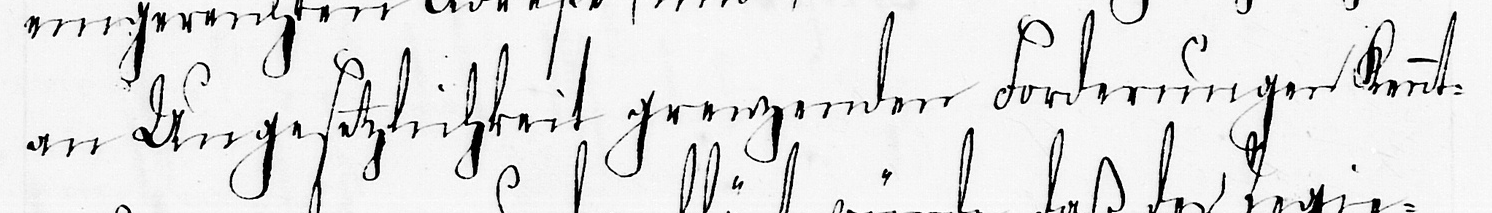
an Ungesetzlichkeit grenzenden Forderungen Kenn¬
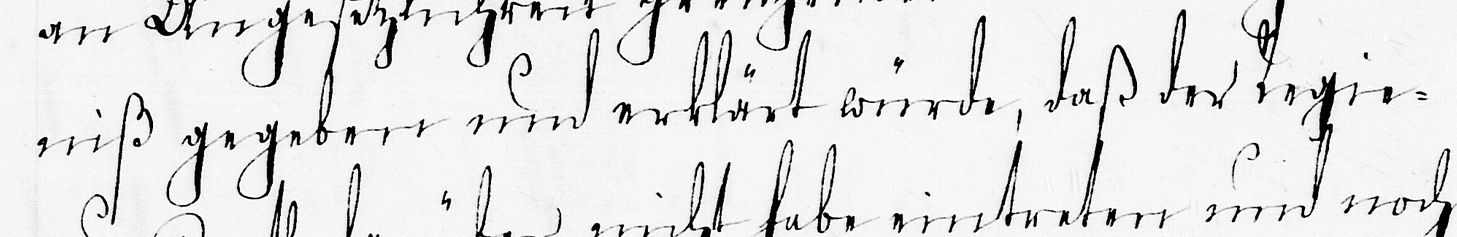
tniß gegeben und erklärt würde, daß der Regie¬
